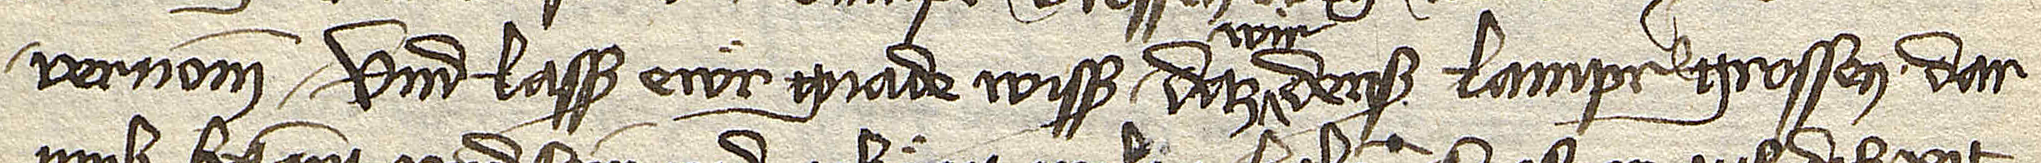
vernom* / Vnd laſſ* eẅr gnade wiſſ* / daʒ denſ* Lampr* groſſen . dar
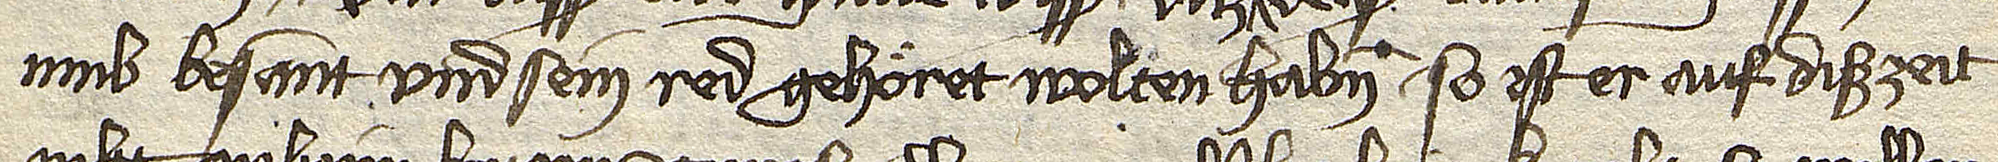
umb beſant vnd ſein red gehöret wolten habn* / ſo iſt er auf diſʒ ʒeit
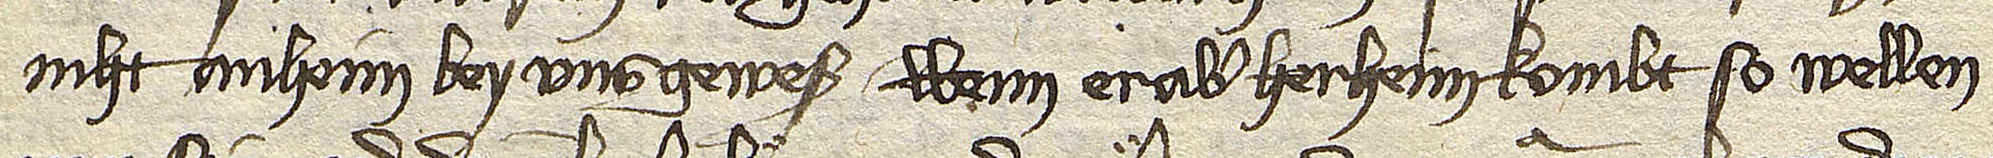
niht anheim bey vns geweſ* / wenn er ab* herheim kombt ſo wellen
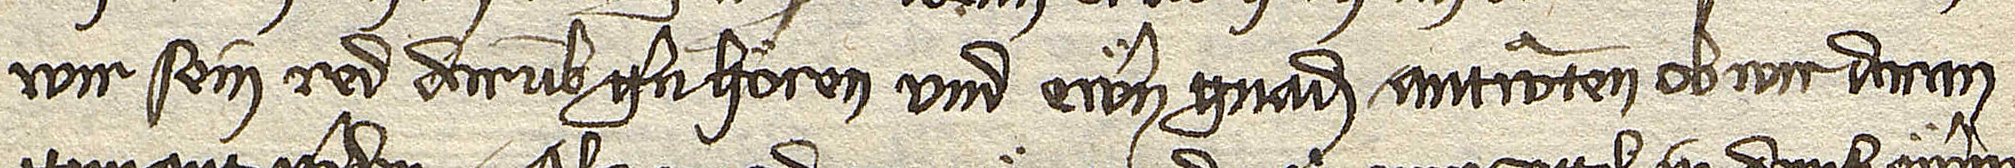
wir ſein red darub* g*n hören vnd eẅ*n gnad* / antw*ten ob wir daran
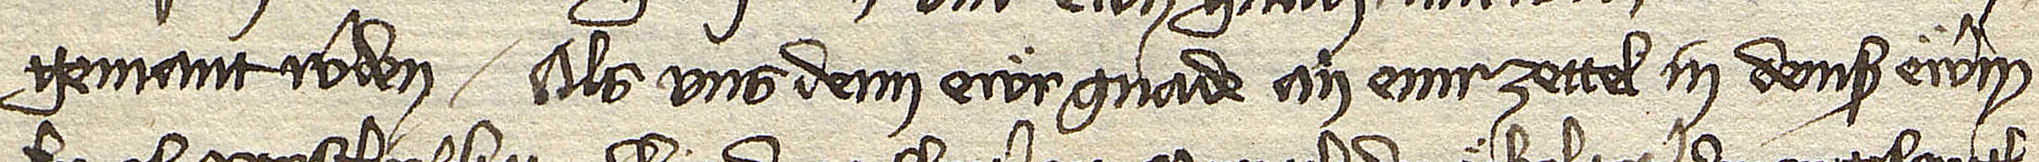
gemant w*den / Als vns denn eẅr gnade an einr ʒettel in demſ* eẅ*m
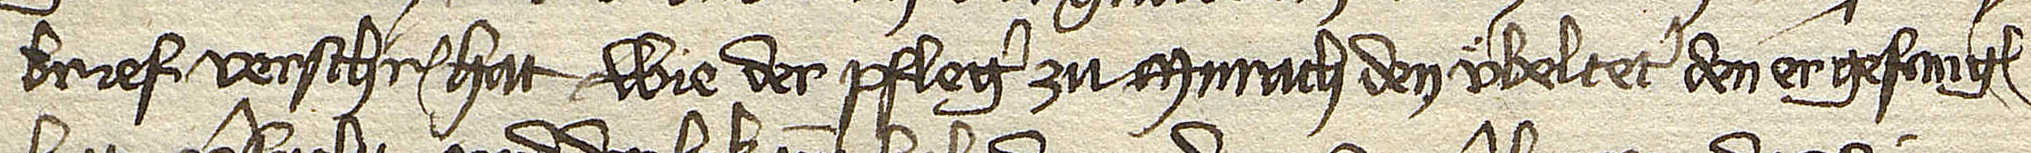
brief verſchr* hat / wie der pfleg* ʒu Murach den v̈beltet* den er gefang*
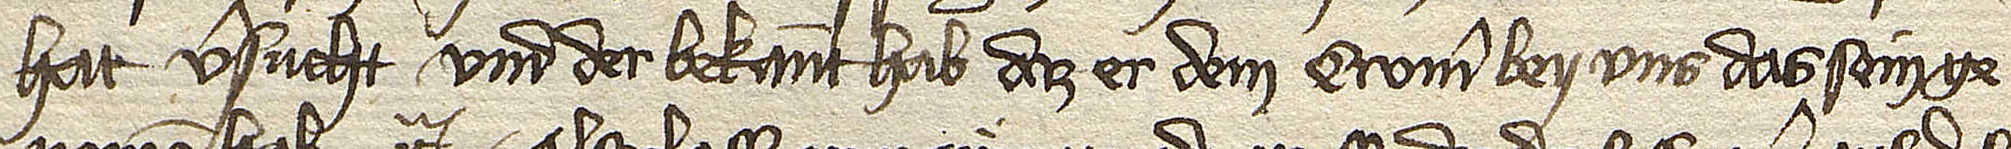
hat v*ſucht / vnd der bekan*t hab daʒ er dem Crom* bey vns das ſein ge
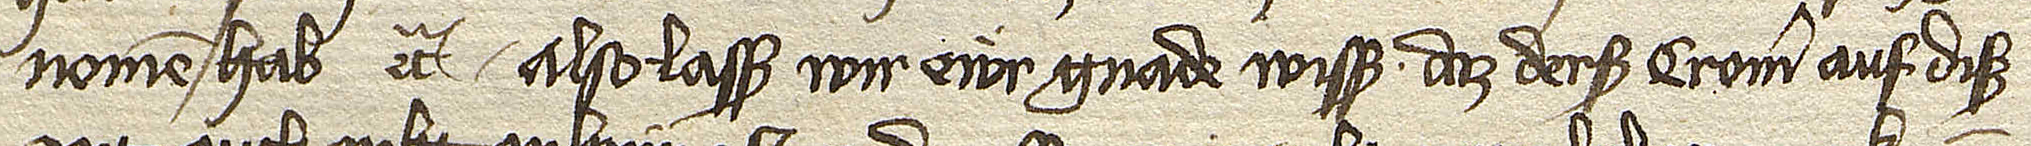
nome* hab ec* / Alſo laſſ* wir eẅr gnade wiſſ* . daʒ derſ* Crom* auf diſʒ
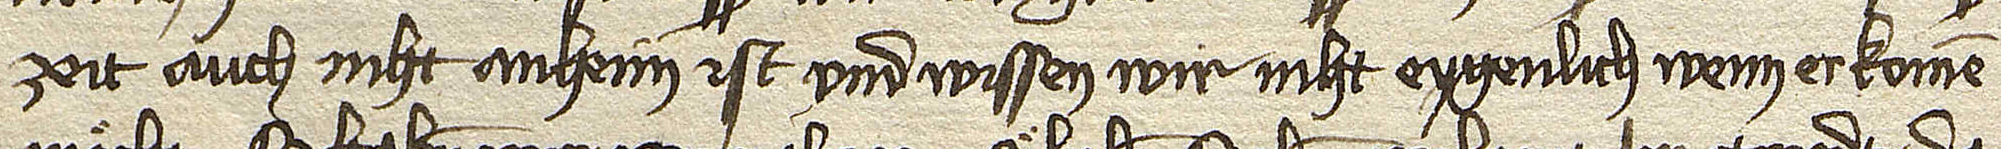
ʒeit auch niht anheim iſt vnd wiſſen wir niht eygenlich wenn er kome*
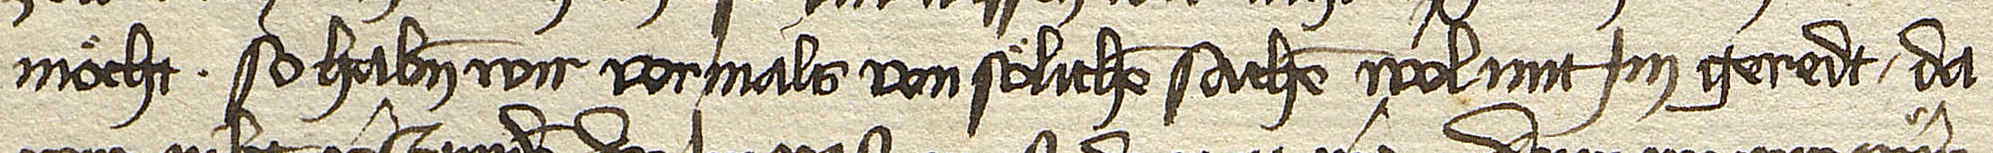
möcht . ſo habn* wir vormals von ſöliche* ſache* wol mit Im geredt / da
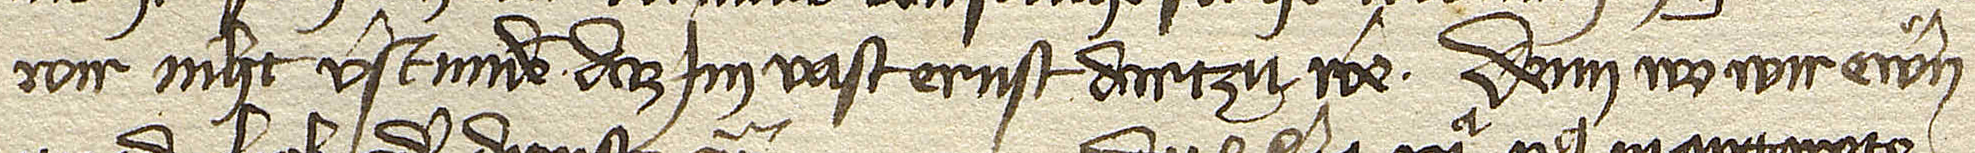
wir niht v*ſtunde* . daʒ Im vaſt ernſt darcʒu w*e . Denn wo wir eẅ*n
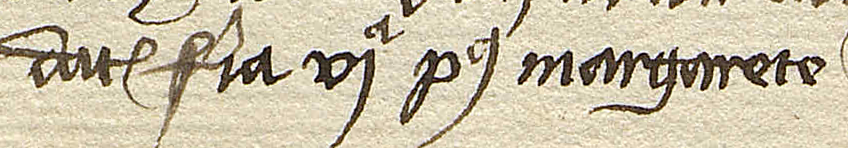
dat* fi*a vi* p* margarete
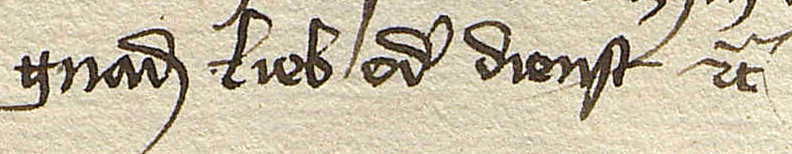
gnad* lieb od* dienſt ec*
